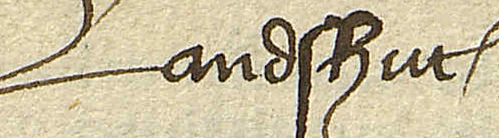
Landſhut
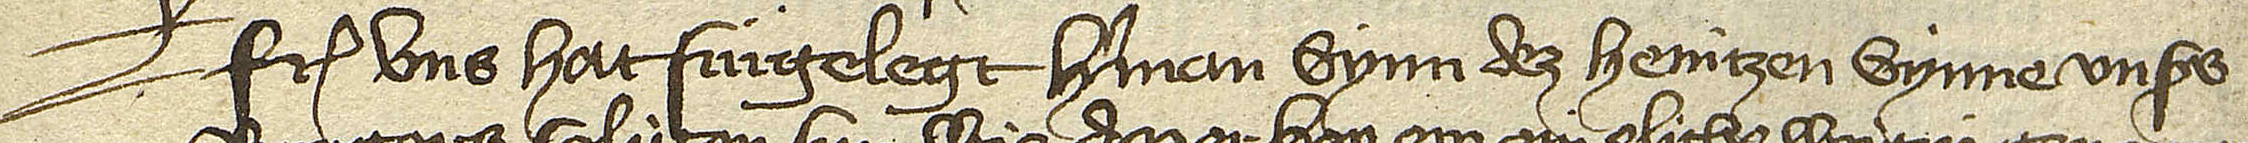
L* fr* vns hat fürgelegt h*man Synn deʒ heincʒen Synne vnſ*s
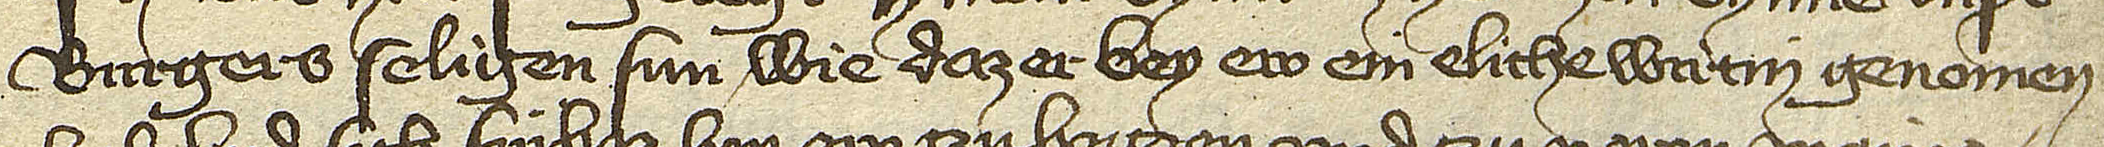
Burgers ſeligen ſun / wie daʒ er bey ew ein eliche wirtin genomen
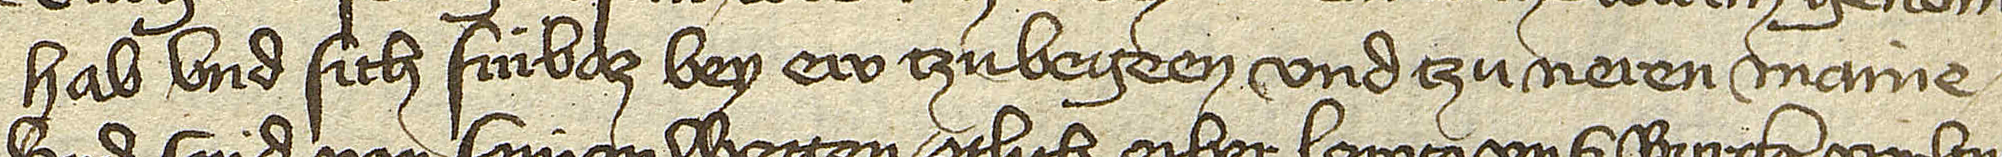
hab vnd ſich fürbaʒ bey ew cʒu begeen vnd cʒu neren maine /
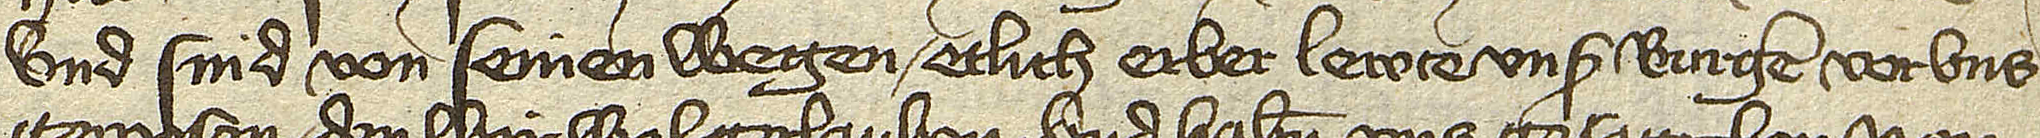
vnd ſind von ſeinen wegen / etlich erber lewte vnſ* Burge* vor vns
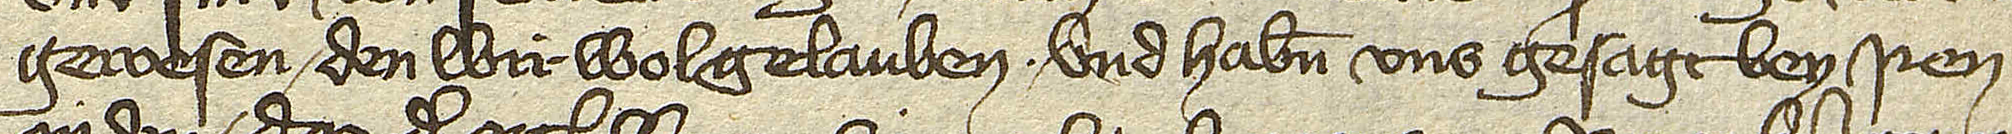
geweſen / den wir wol gelauben . / vnd habn* vns geſagt bey Iren
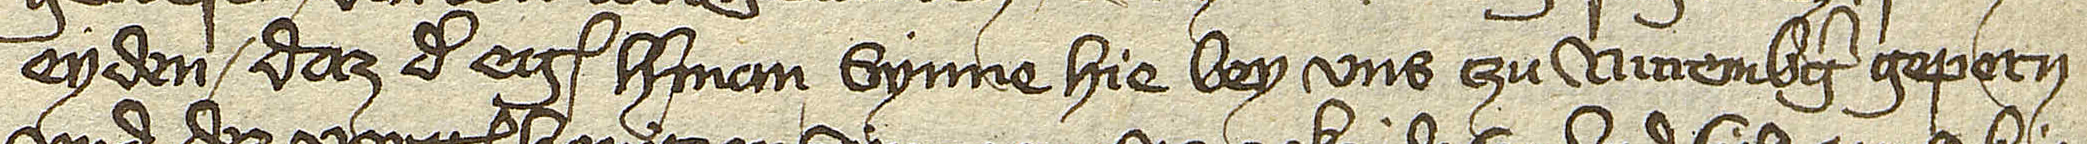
eyden / daʒ d* eg* h*man Synne hie bey vns cʒu Nuremb*g gepotn
